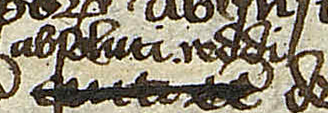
abſoluti reddi
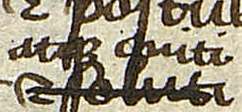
atq* amici
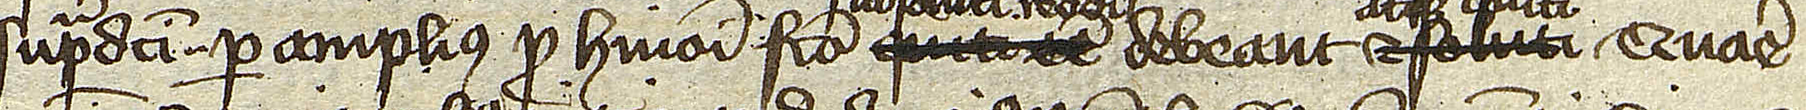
ſup*d*c*i ~ p* ampli* p* hu*o*i F*co %%% debeant @ ſ%luti / Qua*e
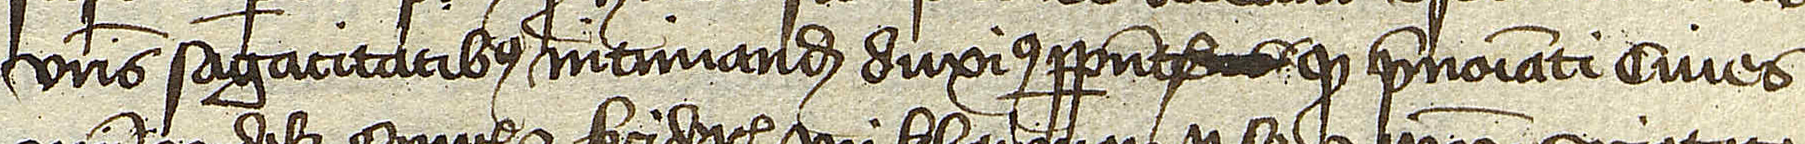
v*ris sagacitatib* intimand* duxi* p*p*nt* %%% q* p*notati Ciues
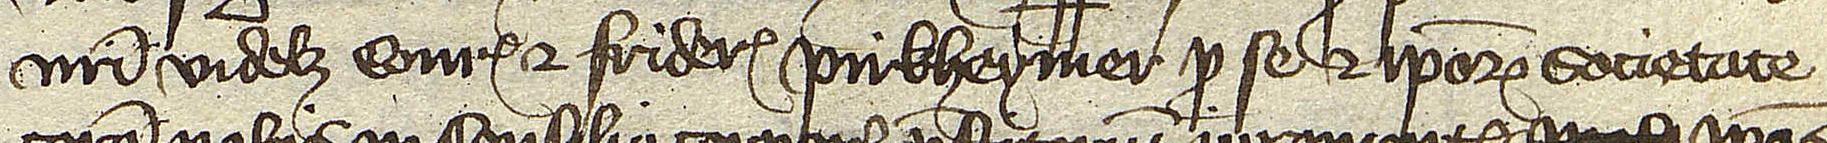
n*ri videl* Conr* @ Frider* Pirkheymer p* ſe @ ip*or* Societate
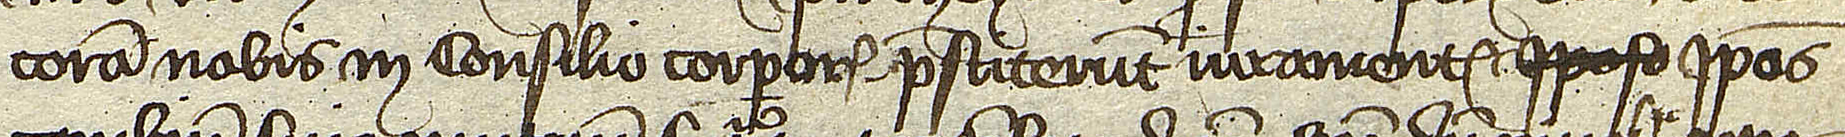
cora* nobis in Conſilio corpor* p*ſtiter*t iurament* / Ipoſ% Ip*os
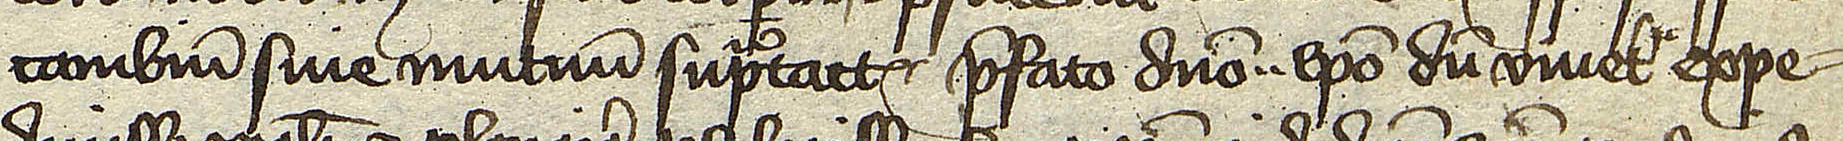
cambiu* ſiue mutuu* ſup*tact* / p*fato d*no ~ Ep*o du* viuet* expe =
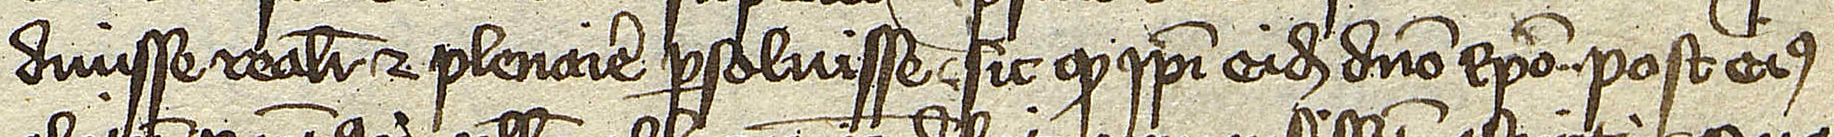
diuisse real*r @ plena*ie p*soluiſſe / ſic q* Ip*i eid* d*no Ep*o poſt ei*
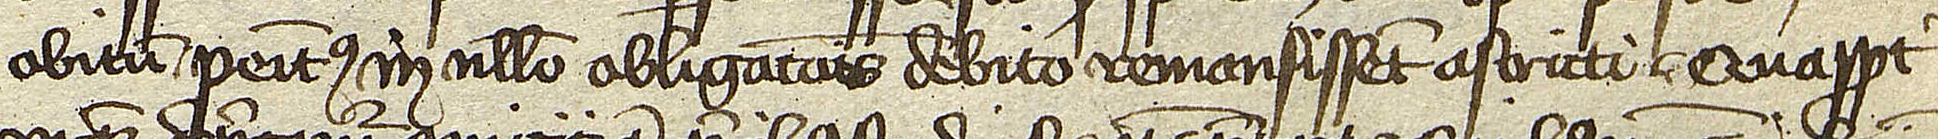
obitu* / pe*it* in n*llo obligac*es debito remanſiſſe*t aſtricti / Qua p*pt*
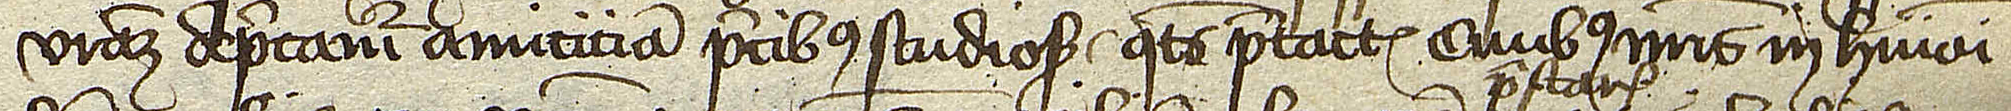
v*ra* dep*can* amicicia* / P*cib* ſtudioq* / q*t*s p*tact* Ciuib* n*ris in hui*o*i
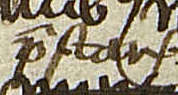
p*ſtar*
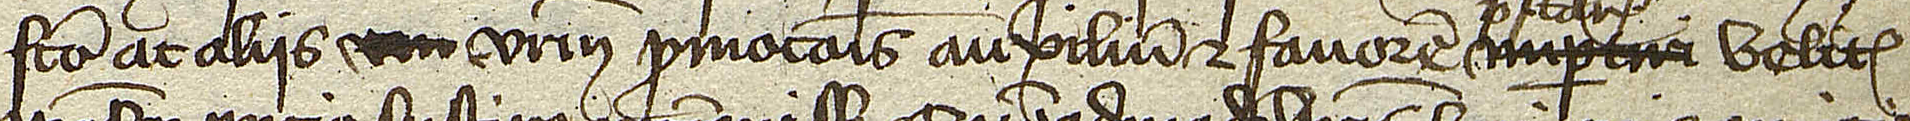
F*co ac aliis %%% v*r*m p*moc*is auxiliu* @ fauore* nup*tiri velit*
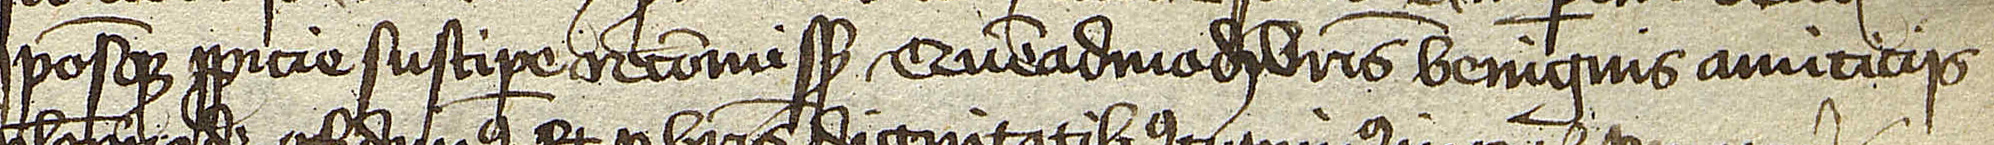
Ip*oſq* p*picie ſuſcip*e recon*iſſ* / Que*admod* v*ris benignis amiciciis
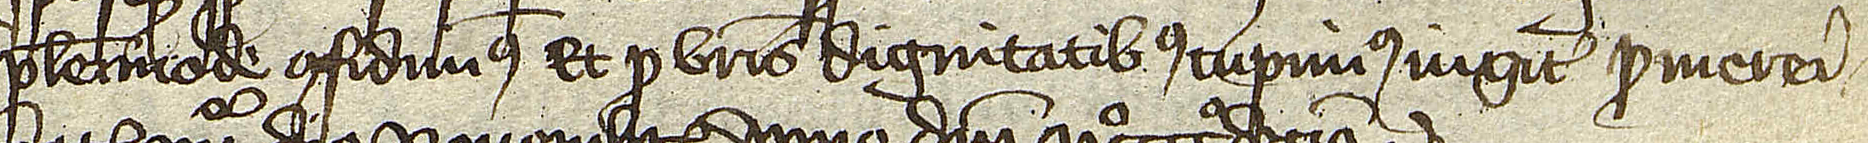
ple*imode *fidim* Et p* v*ris dignitatib* cupim* iu*it* p*mer*i /
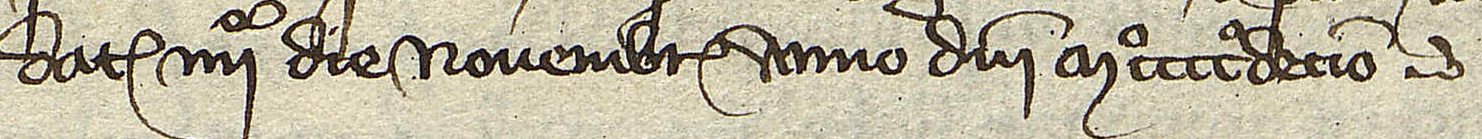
Dat* iiii* die Nouembr* Anno d*m* M*cccc*deci*o §
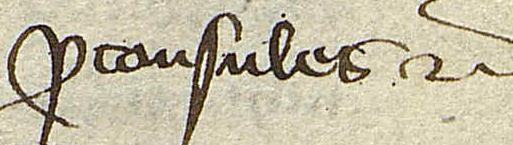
P*conſules ec*
